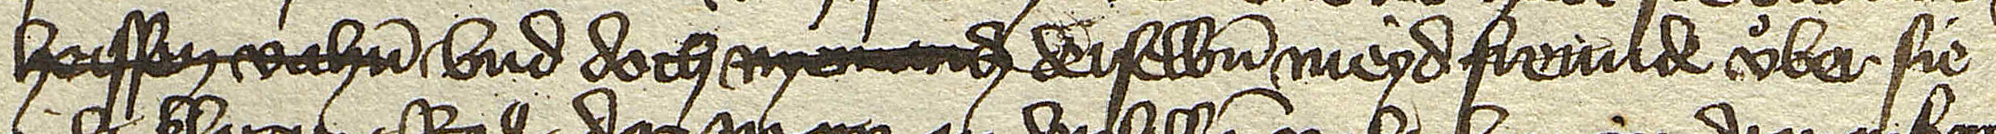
heiſſen vahn* / vnd doch nyemand* derſelbn* meyd freunde v̈ber ſie
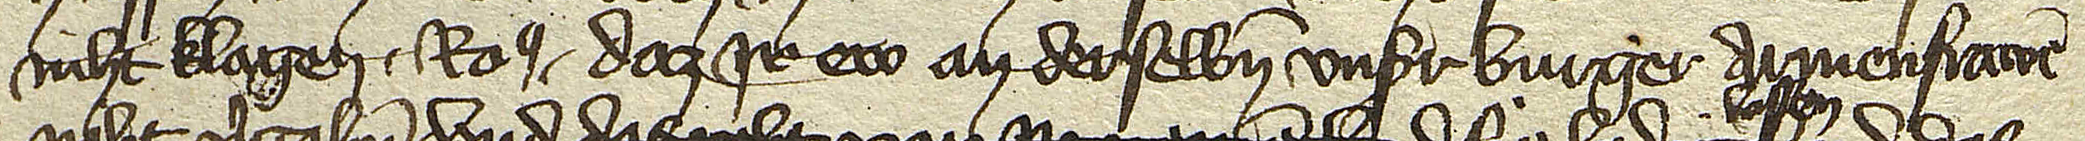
niht klagen / Ro* / daʒ Ir ew an derſelbn* vnſ*r burger Armenfrawe*
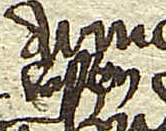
laſſen
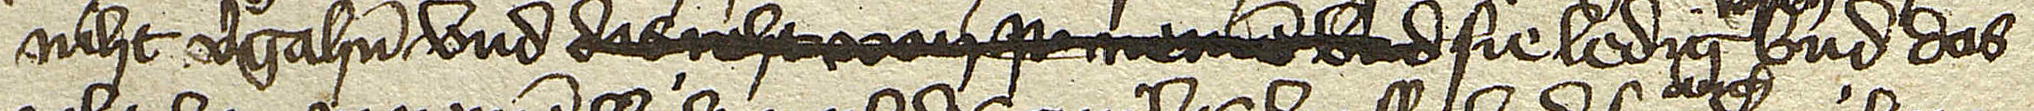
niht v*gahn* / vnd das reht von Ir neme* vnd ſie ledig vnd das
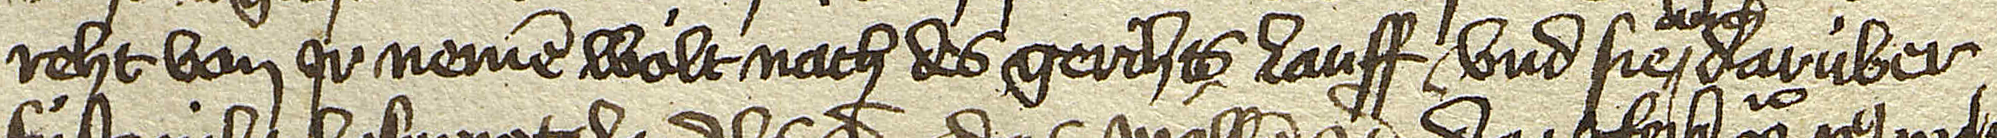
reht von Ir neme* wölt nach des gerihts lauff / vnd ſie darüber
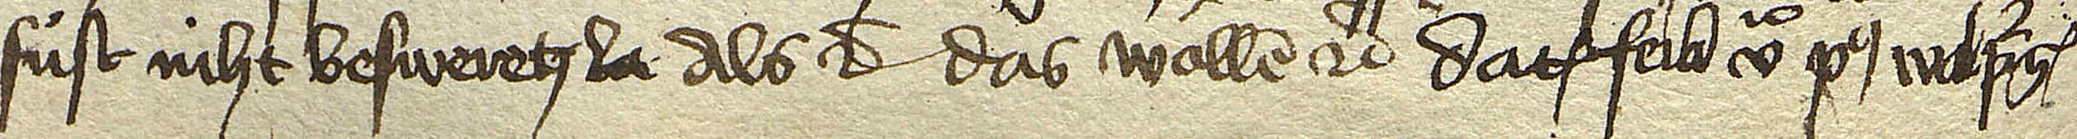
ſüſt niht beſweren la Als ec* das wölle* ec* dat* feia* v* p* walp*g*
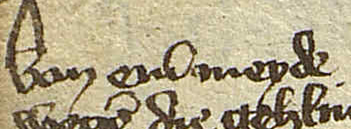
von ein* meyde
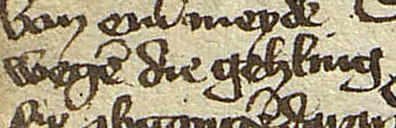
wege* die gehling
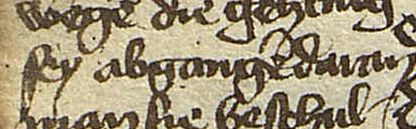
ſey abgange* daran
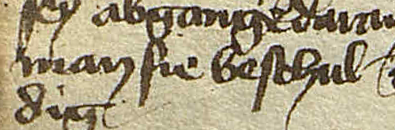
man ſie beſchul -
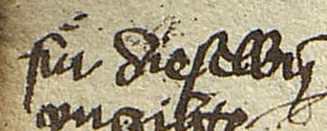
für dieſelbn*
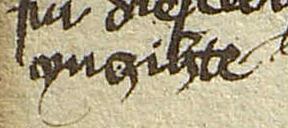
yncʒihte
